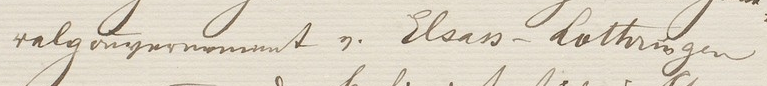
ralgouvernement v. Elsass–Lothringen
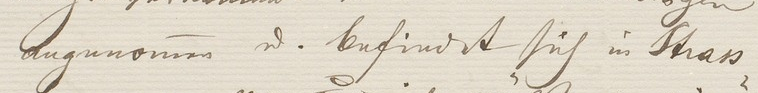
angenommen u. befindet sich in Strass-
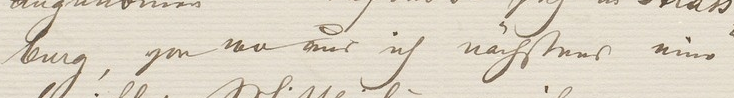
burg, von wo aus ich nächstens eine
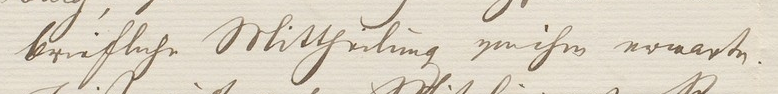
briefliche Mittheilung von ihm erwarte.
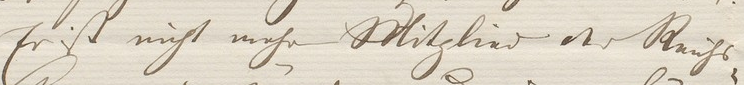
Er ist nicht mehr Mitglied des Reichs-
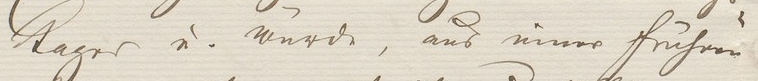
tages u. würde, aus einer frühren
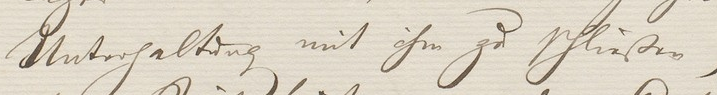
Unterhaltung mit ihm zu schließen,
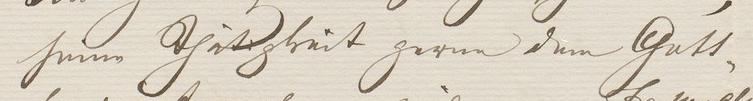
seine Thätigkeit gerne dem Gott-
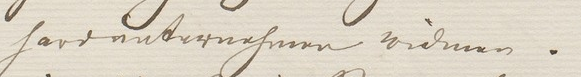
hardunternehmen widmen. Er
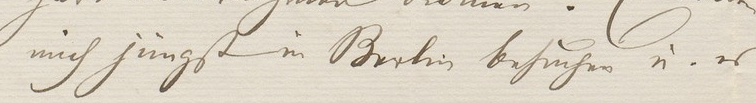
mich jüngst in Berlin besuchen u. es
